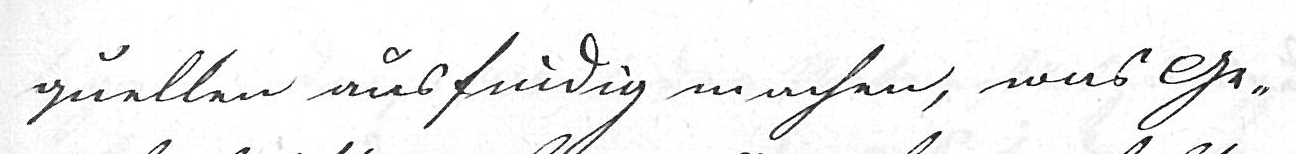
quellen ausfindig machen, was Ge-
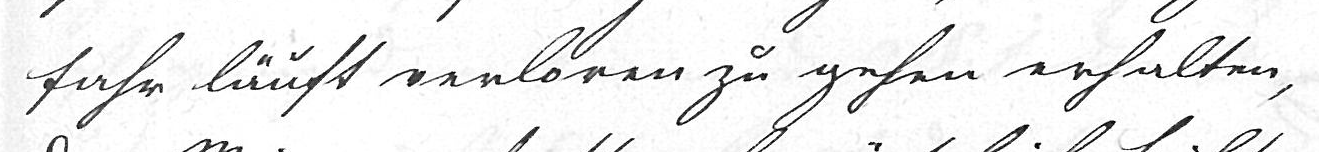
fahr läuft verloren zu gehen erhalten,
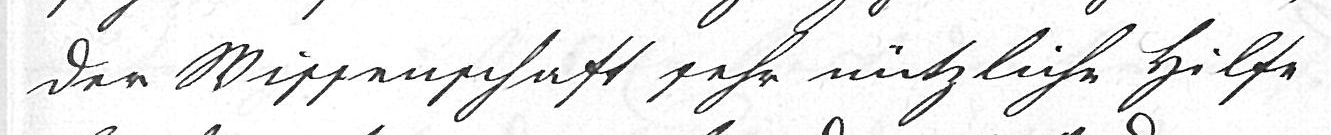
der Wissenschaft sehr nützliche Hilfe
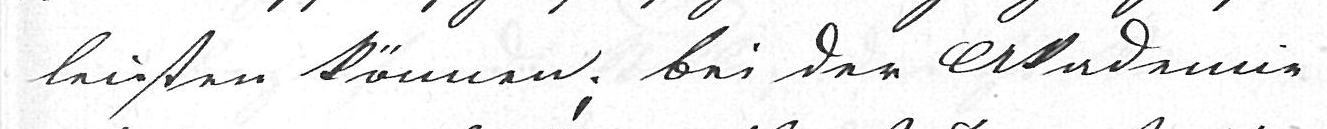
leisten können; bei der Akademie
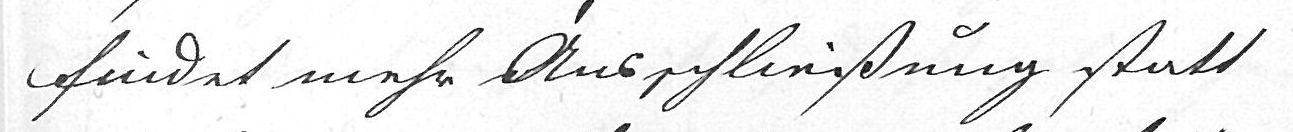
findet mehr Ausschließung statt
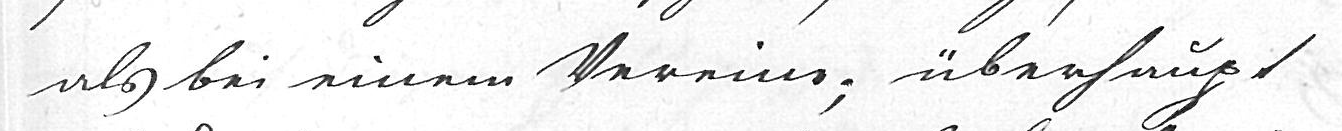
als bei einem Vereine; überhaupt
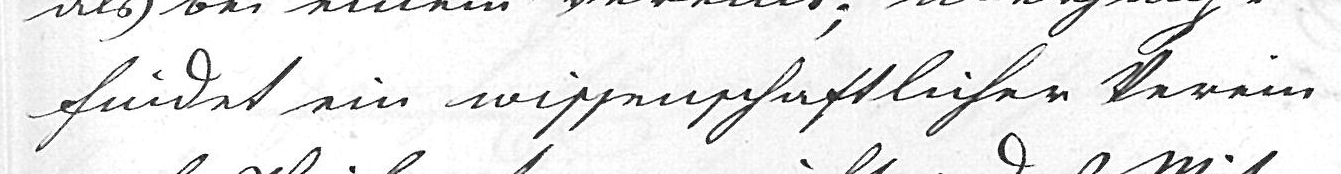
findet ein wissenschaftlicher Verein
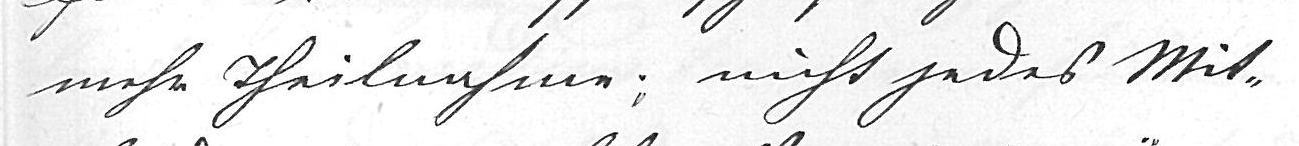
mehr Theilnahme; nicht jedes Mit-
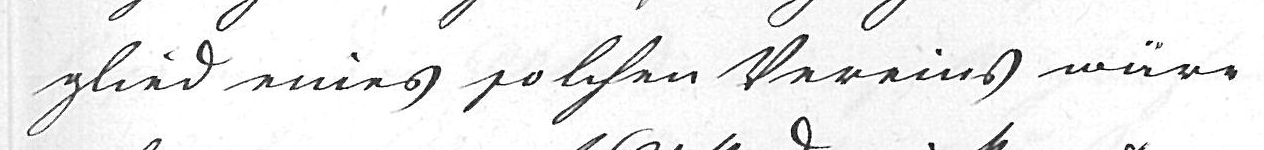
glied eines solchen Vereins wäre
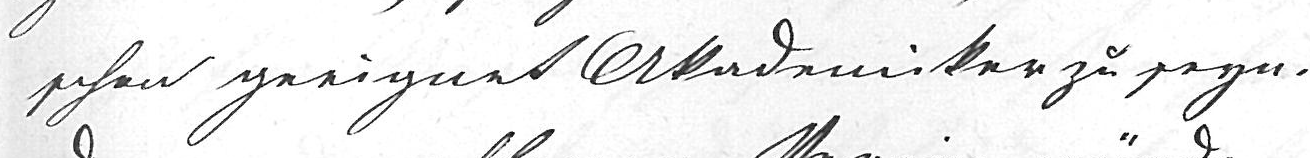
schon geeignet Akademiker zu seyn.
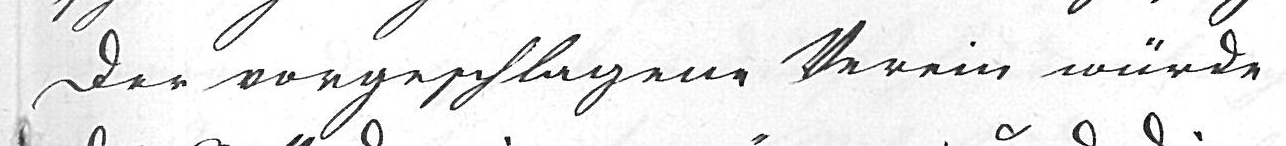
Der vorgeschlagenen Verein würde
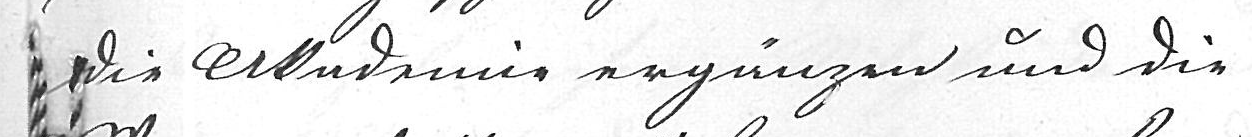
die Akademie ergänzen und die
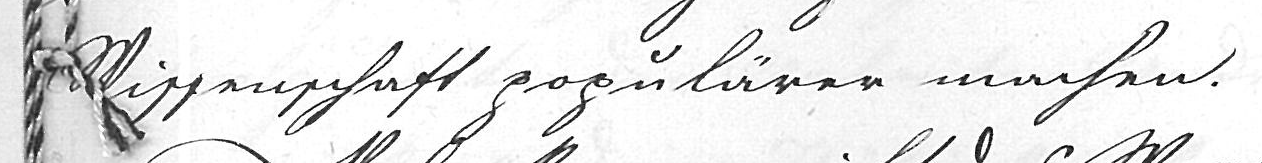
Wissenschaft populärer machen.
